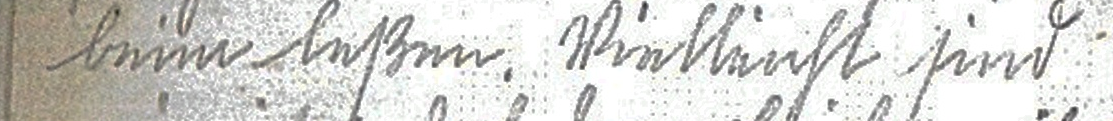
beim leßen. Vielleicht sind
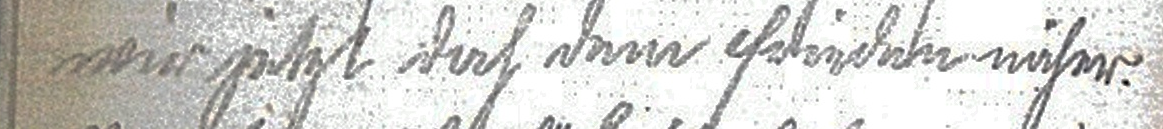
wir jetzt doch dem Scheiden näher.
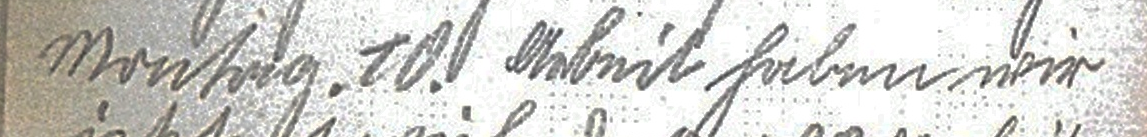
Montag 10. Arbeit haben wir
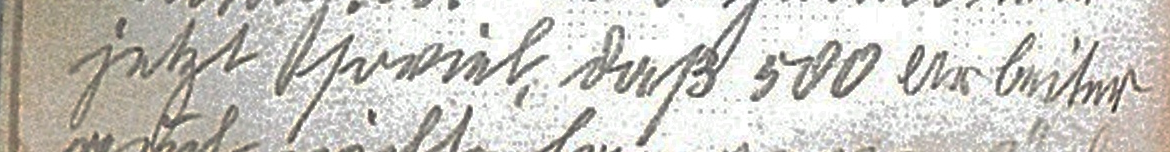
jetzt soviel, daß 500 Arbeiter
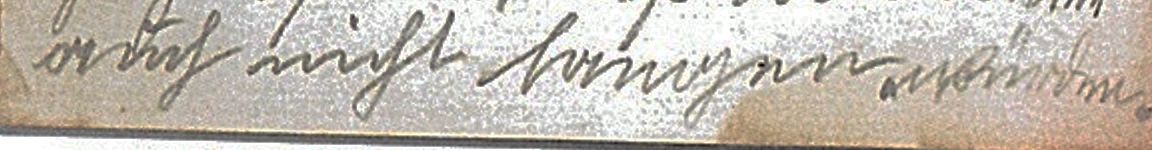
auch nicht langen würden.
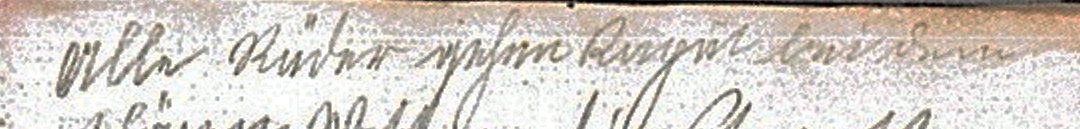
Alle Räder gehen kaput bei dem
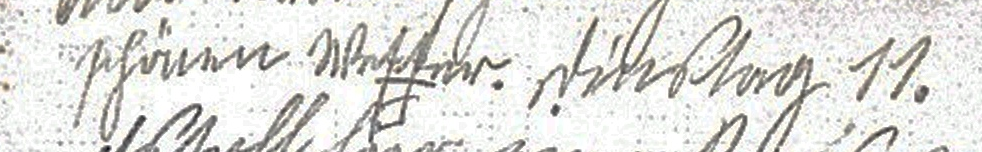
schönen Wetter. Dienstag 11.
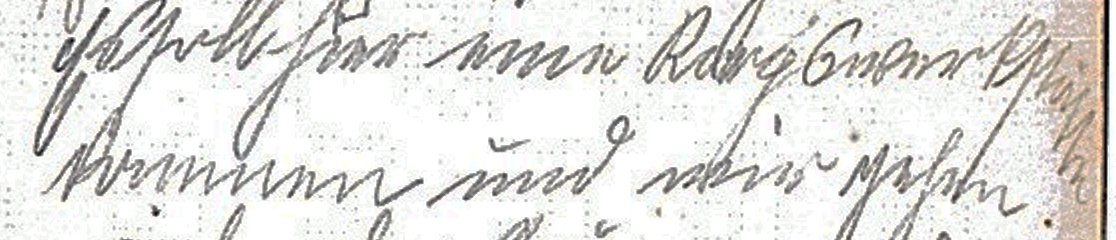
Es soll hier eine xy
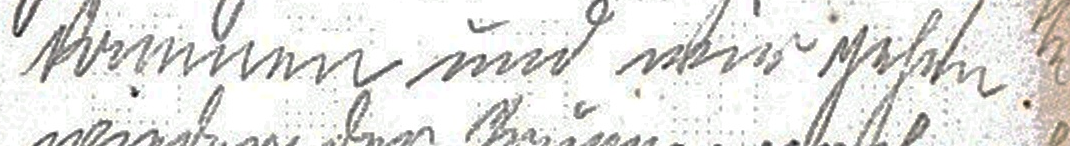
kommen und wir gehen.
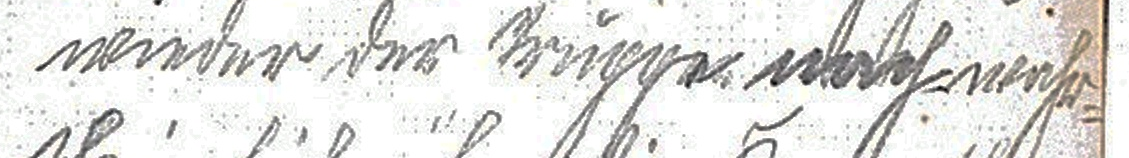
Weder der Gruppe wahr-
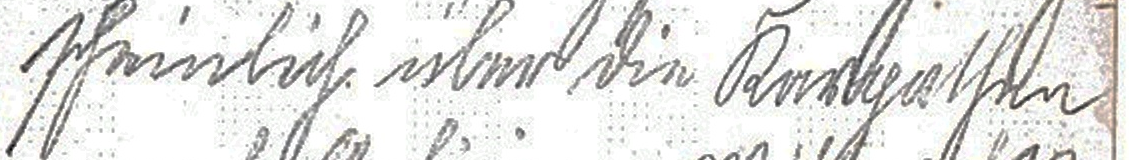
scheinlich über die Karpathen
